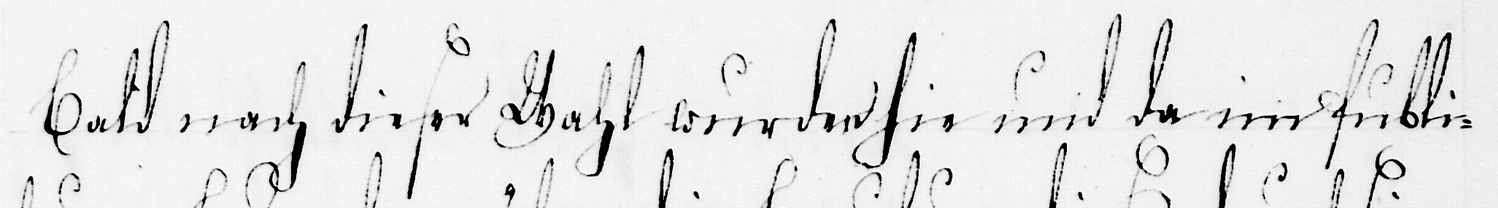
Bald nach dieser Wahl wurden hie und da im Publi¬
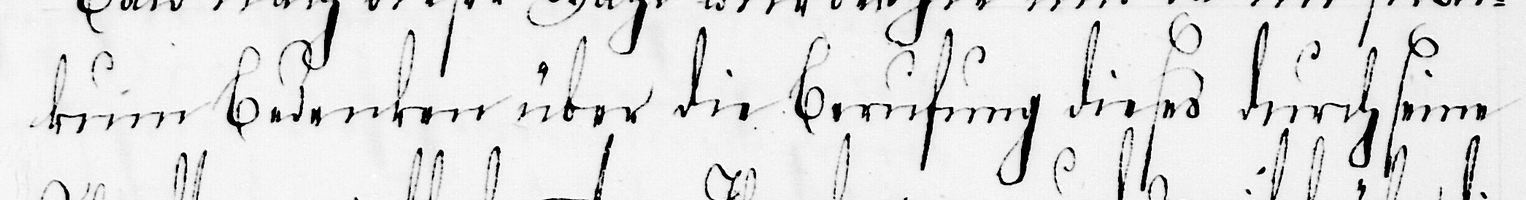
kum Bedenken über die Berufung dieses durch seine
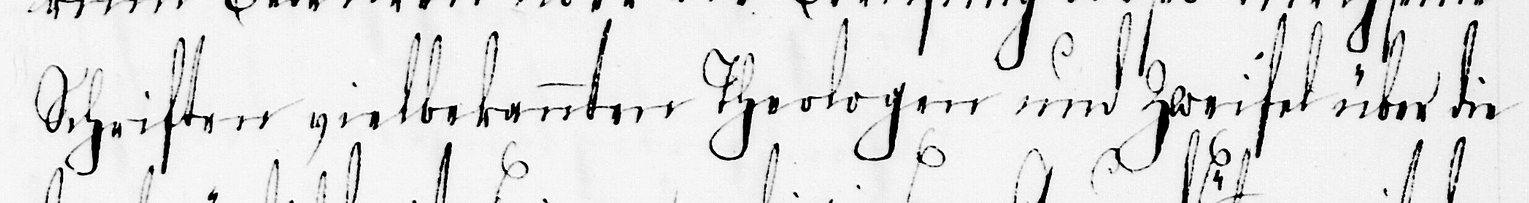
Schriften vielbekannten Theologen und Zweifel über die
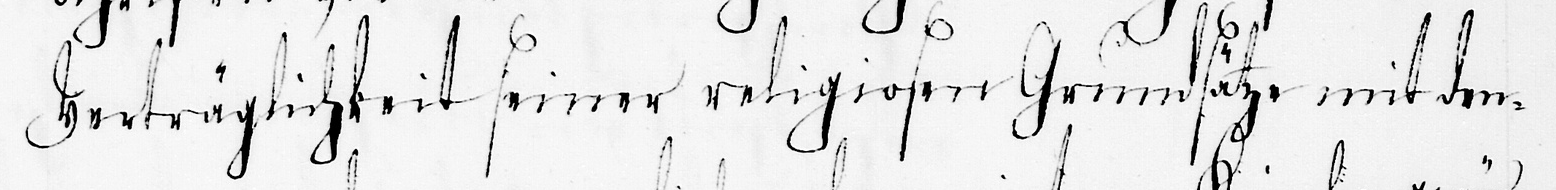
Verträglichkeit seiner religiosen Grundsätze mit den¬
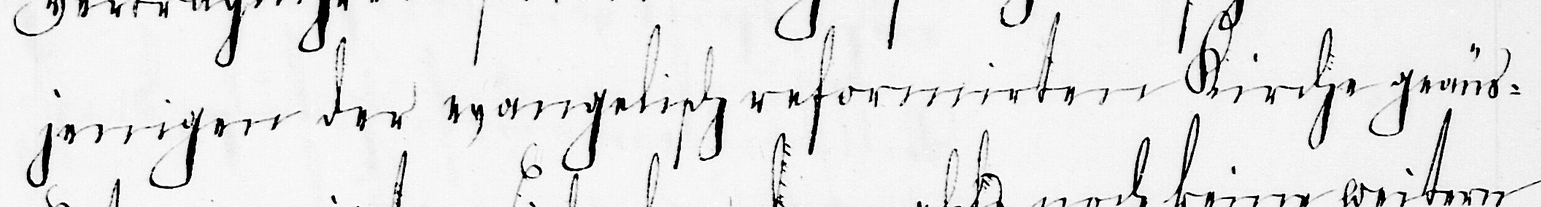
jenigen der evangelisch reformirten Kirche geäuß¬
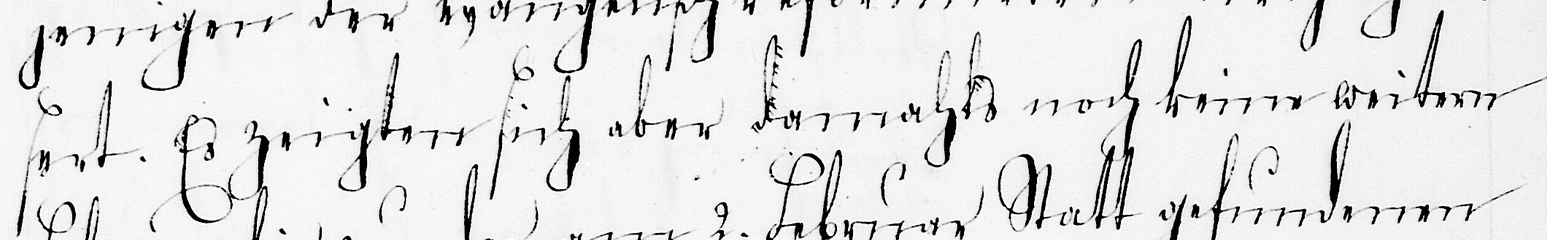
ert. Es zeigten sich aber damahls noch keine weitern
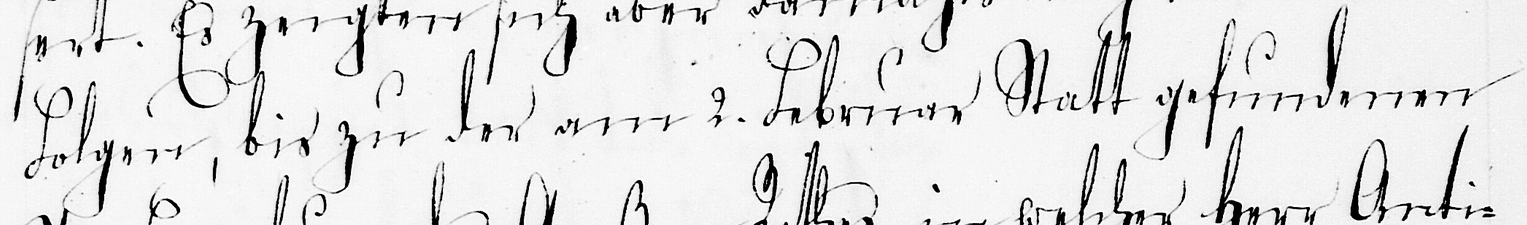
Folgen, bis zu der am 2. Februar Statt gefundenen
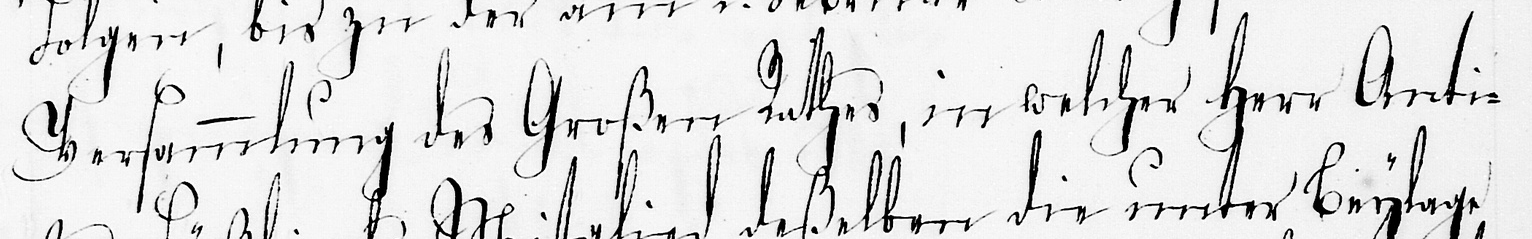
Versammlung des Großen Rathes, in welcher Herr Anti¬
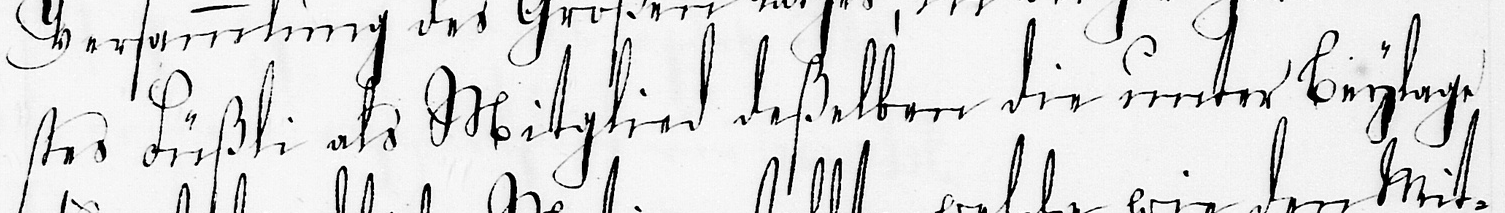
stes Füßli als Mitglied deßelben die unter Beylage
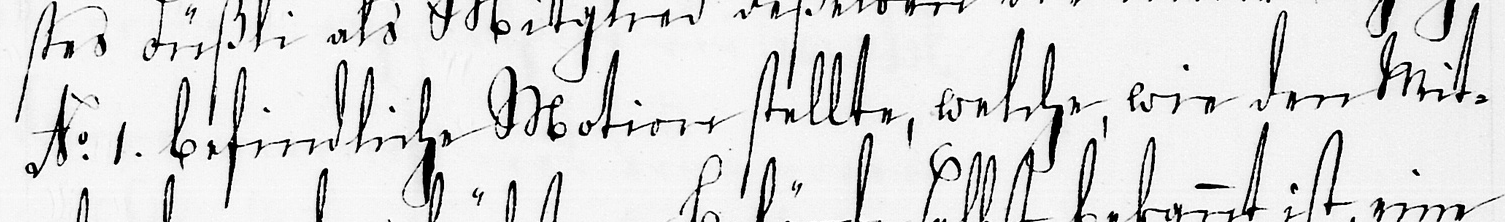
No. 1. befindliche Motion stellte, welche, wie den Mit¬
